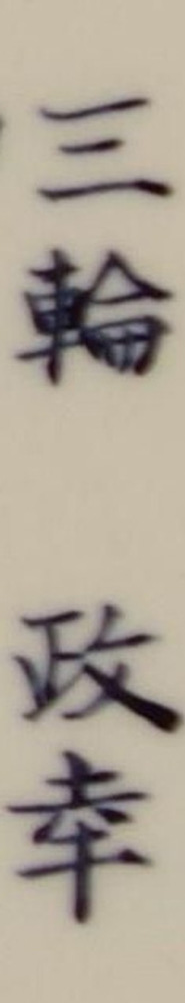三輪政幸
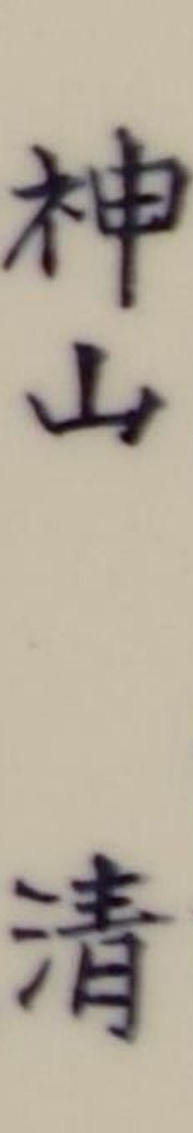神山清
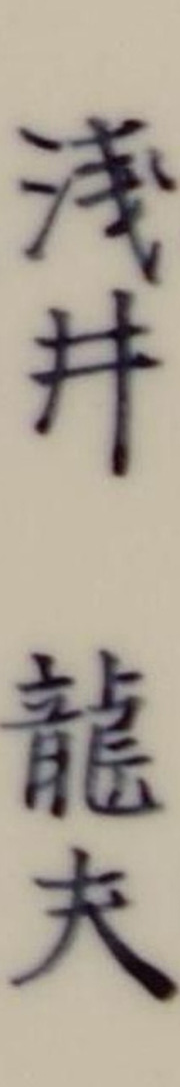浅井龍夫
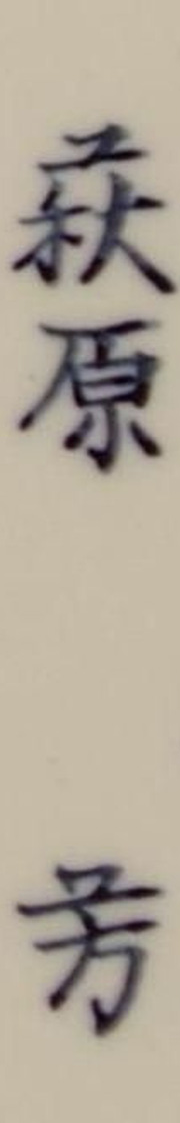萩原芳
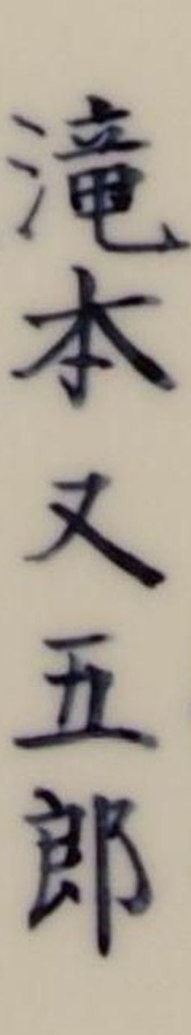滝本又五郎
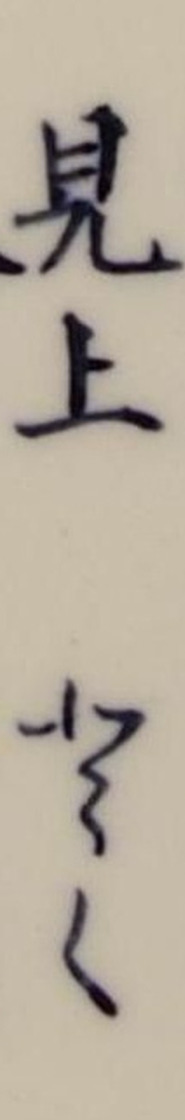見上とく
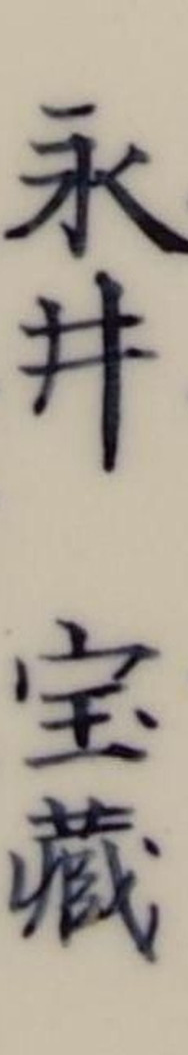永井宝蔵
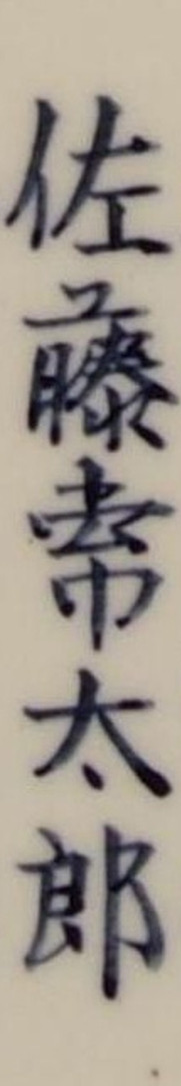佐藤常太郎
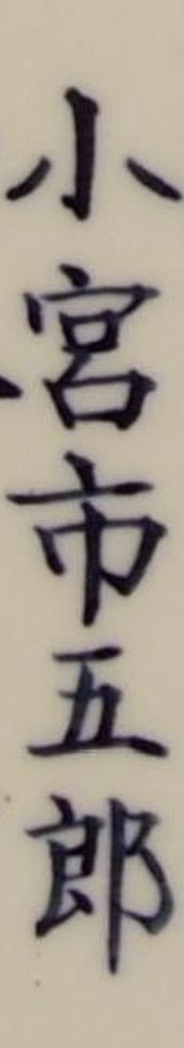小宮市五郎
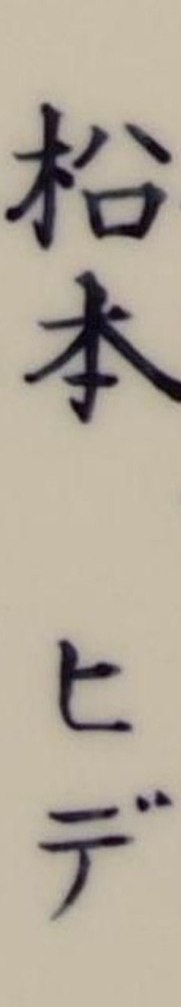松本ヒデ
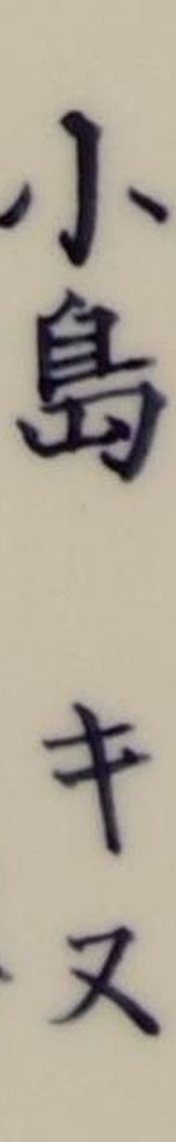小島キヌ
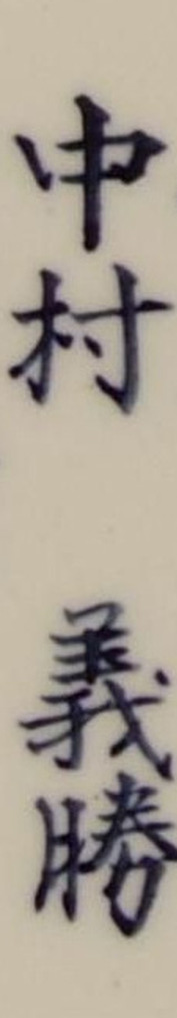中村義勝
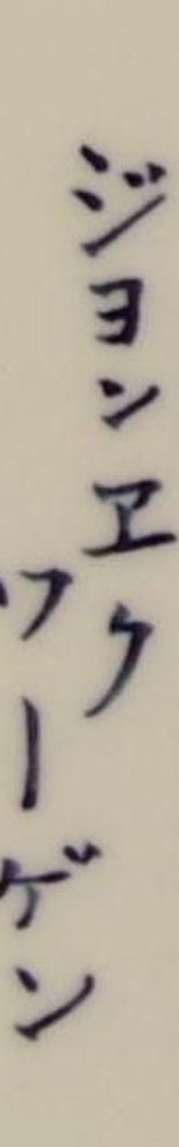ジヨンヱクワーゲン
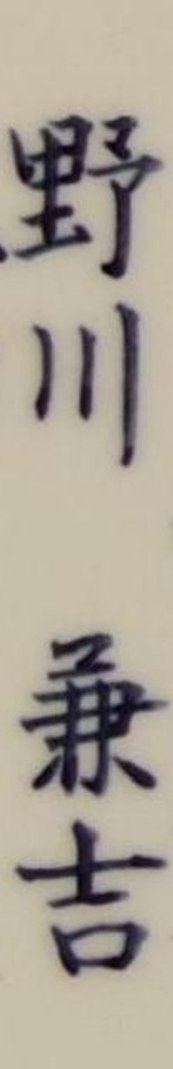野川兼吉
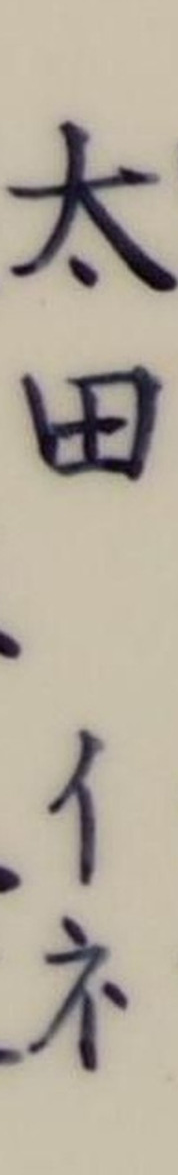太田イネ
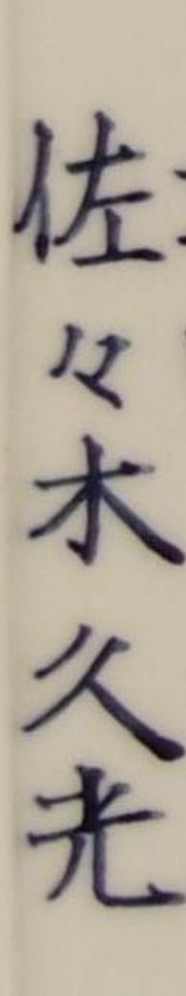佐々木久光
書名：M~S
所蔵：高野山金剛峯寺
